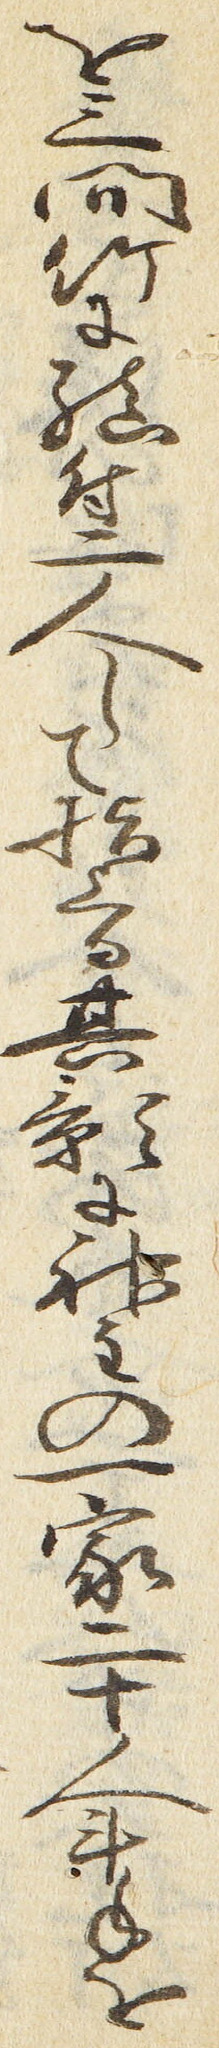を三間竹に結付二人して指上る其影に神主の一家二十人計手を
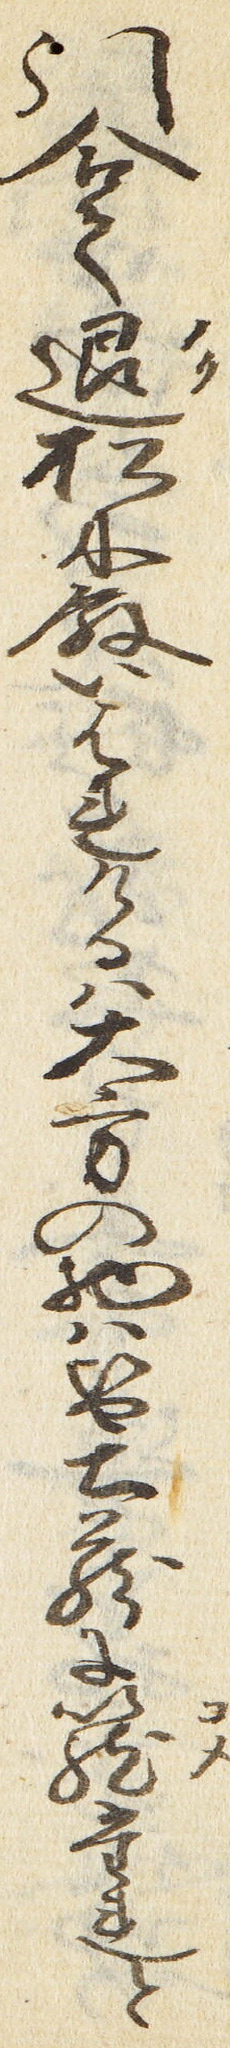引合て退松木殿いはれけるは大方の物は皆土蔵に籠たれと
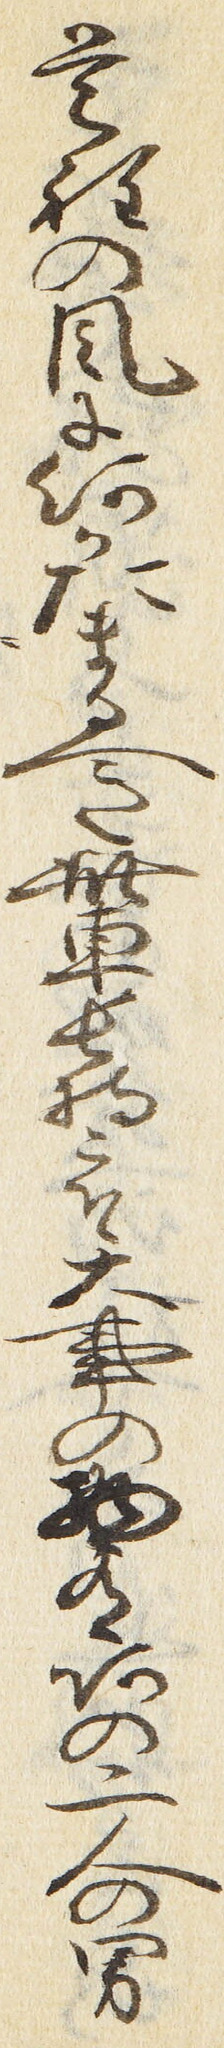是程の風に何かたまるへき此車長持こそ大事の物有あの二人の男
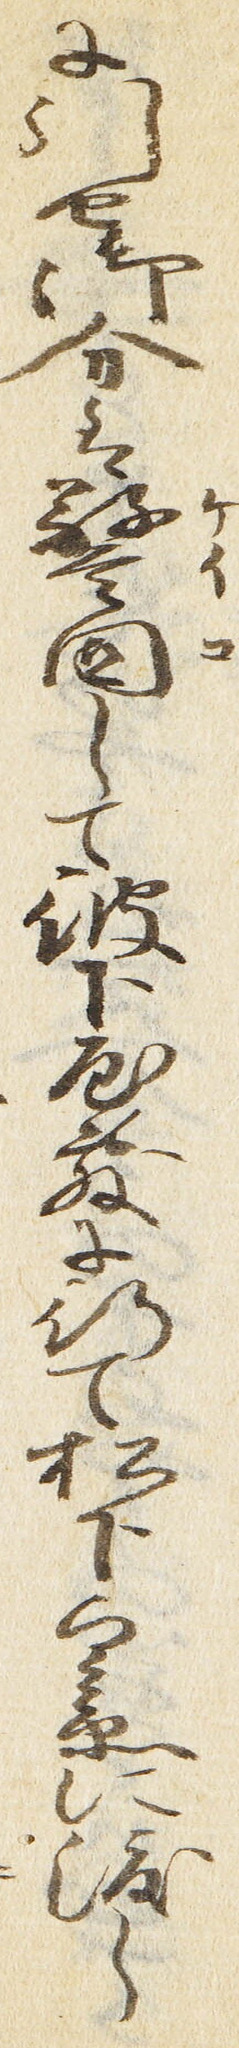に引せ御分は警固して彼下屋敷に行て松下与兵衛に渡し
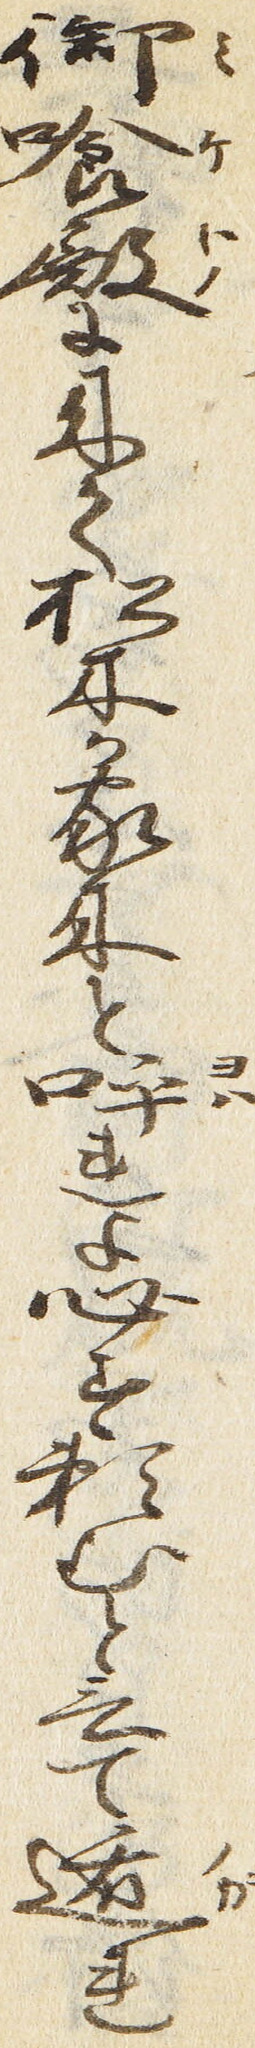御喰殿に来て松木か家来と呼れよ必す頼むと言て遁れ
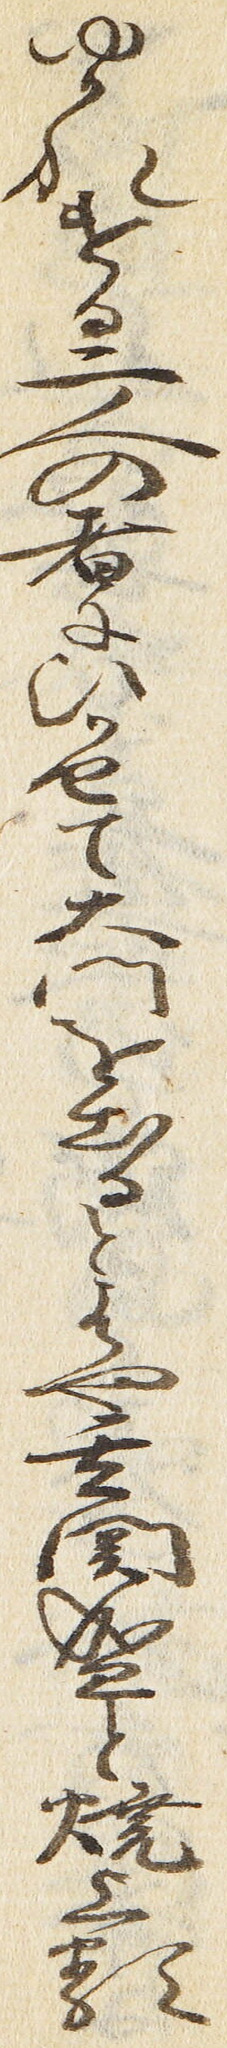ゆかれける二人の者にひかせて大門を出るとはや玄関盛と焼上る
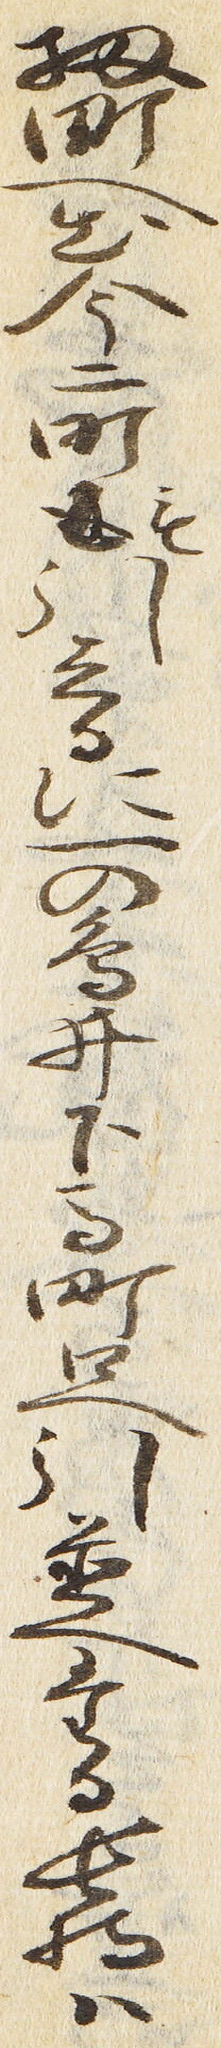扨町へ出今二町も引去るに一の鳥井下馬町口へ引並へたる長持は
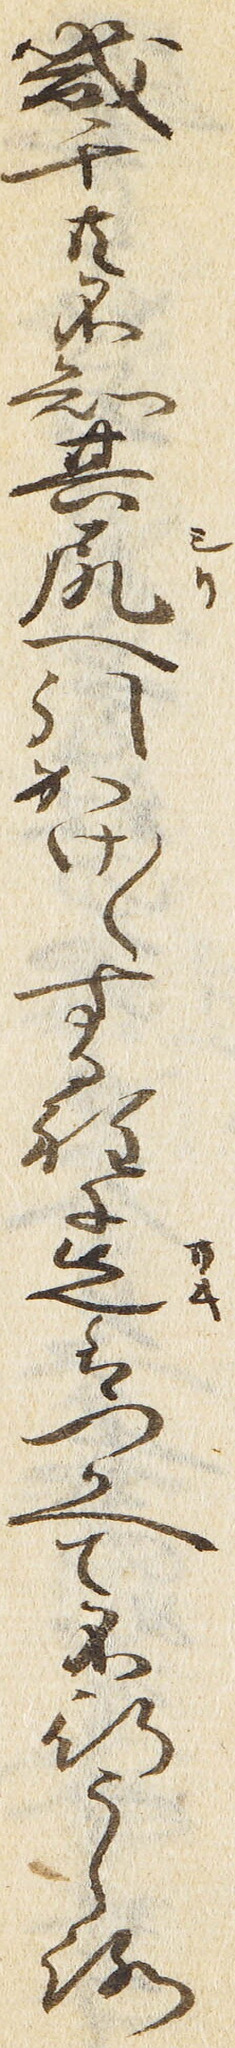幾千共不知其尻へ引かけ〳〵する程に先はつかへて不行うしろ
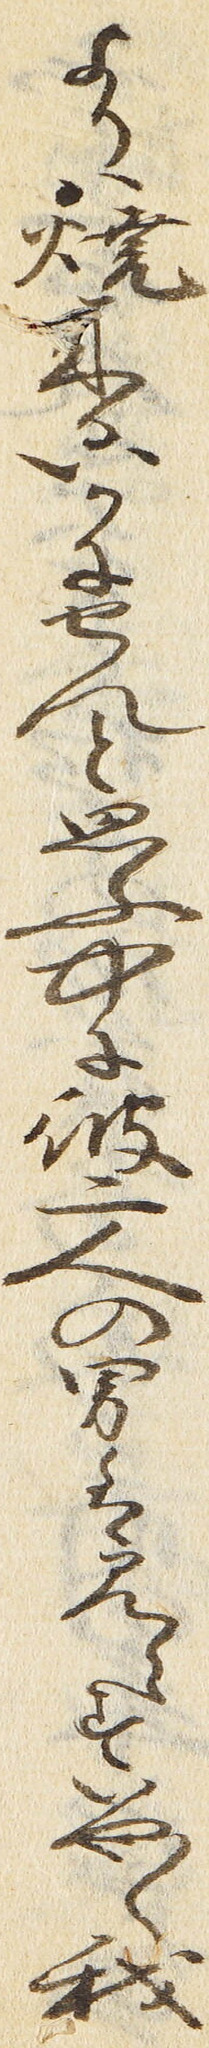よりは焼来るいかにせんと思ふ中に彼二人の男は見えすいや〳〵我
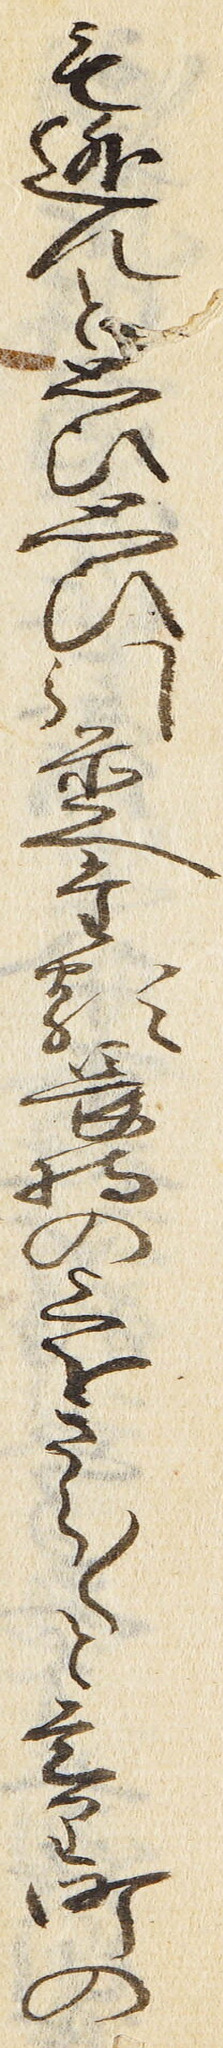も逃んと思ひ思ひ引並へたる長持の上をさら〳〵と走り町の
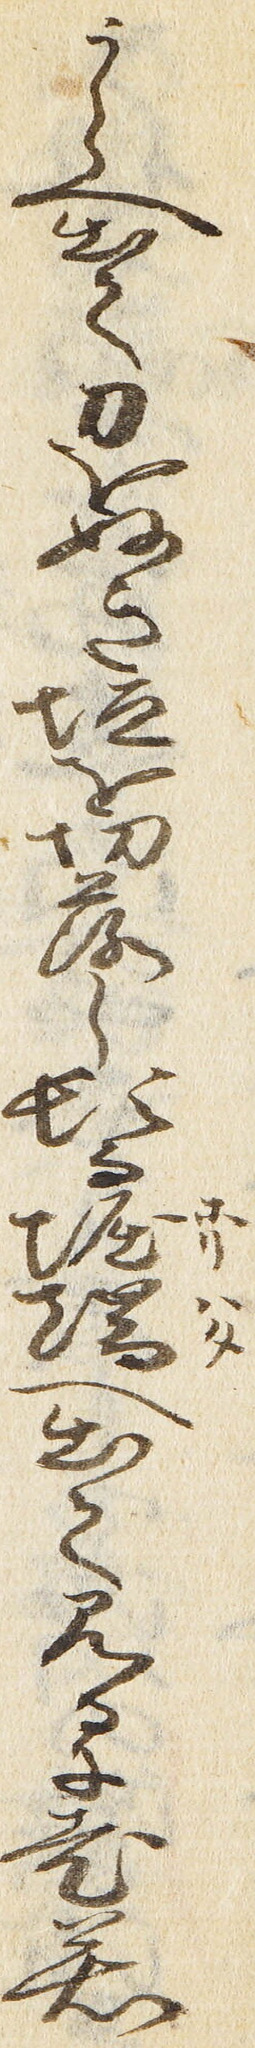うらへ出て刀をぬき垣を切落し頓而堀端へ出て見るに老若
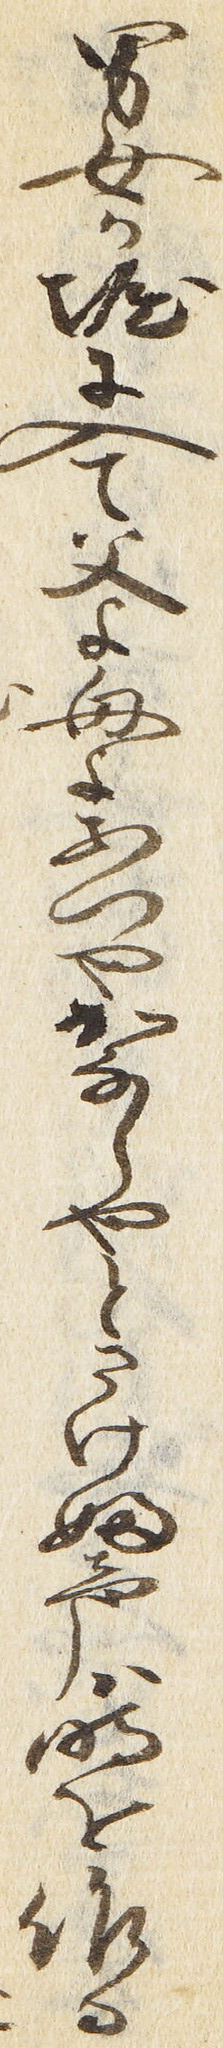男女か堀に入て父よ母よあつやかなしやとさけふ声は時を作る
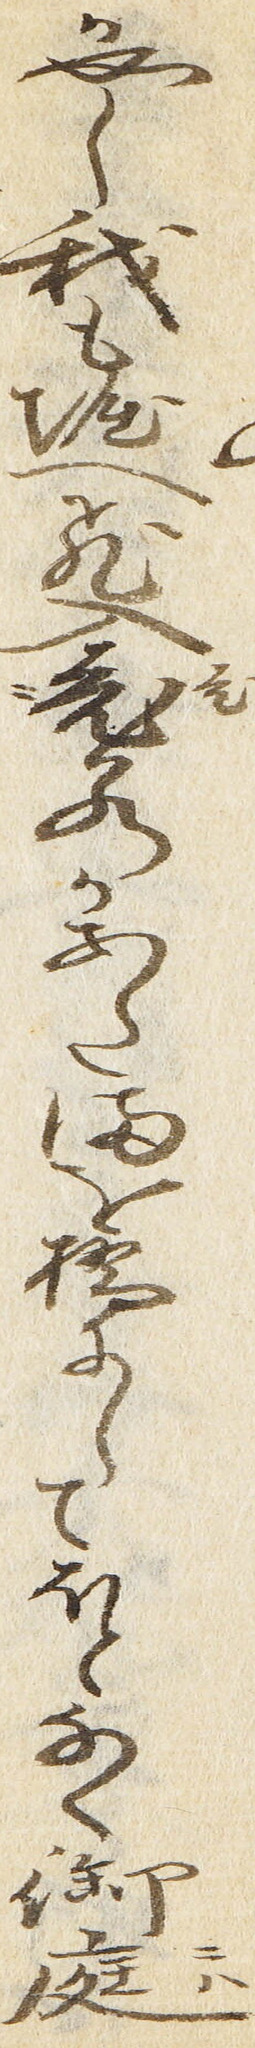か如し我も堀へ飛入老若かあたまを橋にしてほとなく御庭
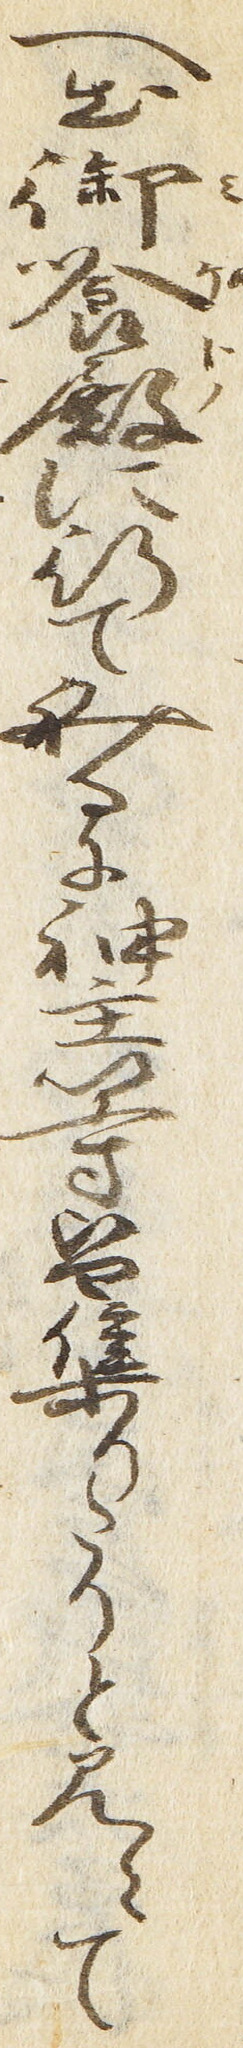へ出御喰殿に行てみるに神主等皆集りたりと見えて
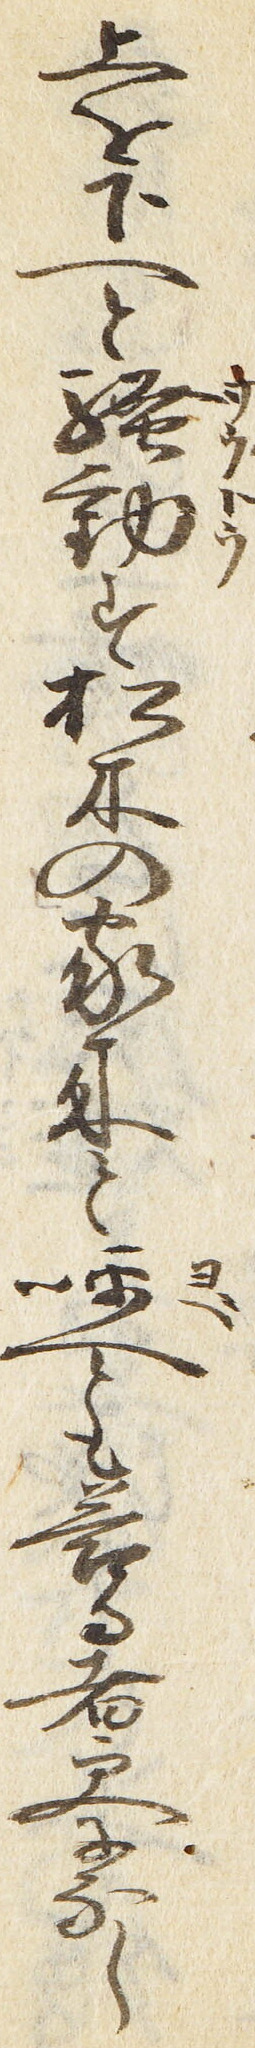上を下へと騒動す松木の家来と呼へとも答る者更になし
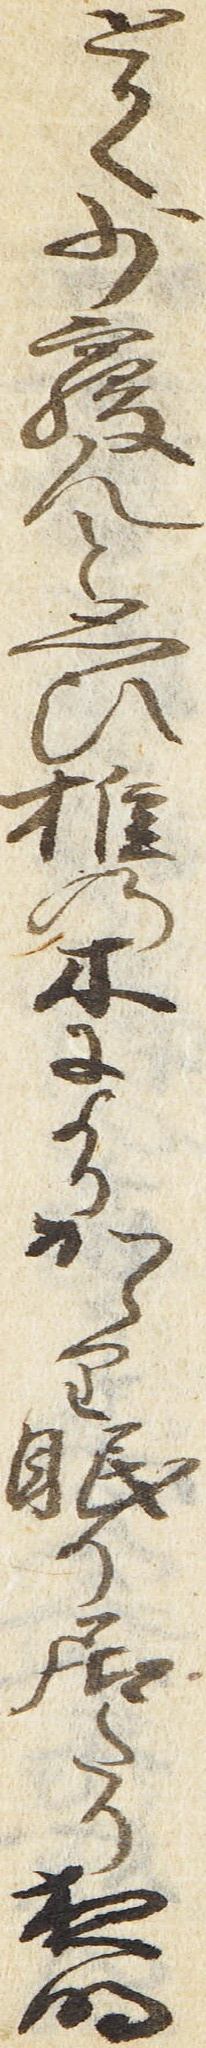とかく少寝んと思ひ椎の木によりかゝり眠り居たり夜明
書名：海陸世話日記
